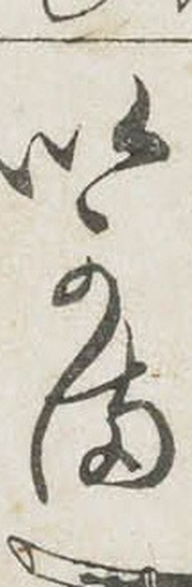いかま
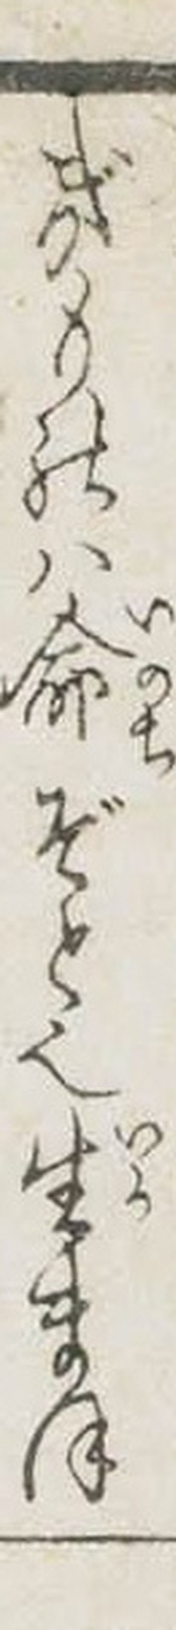きものは命ぞと也生まほ
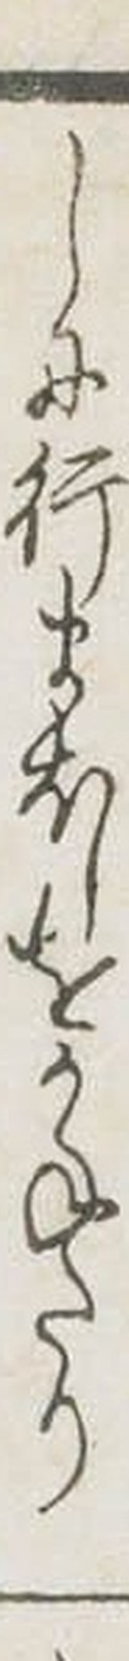しに行まほしをかねたり
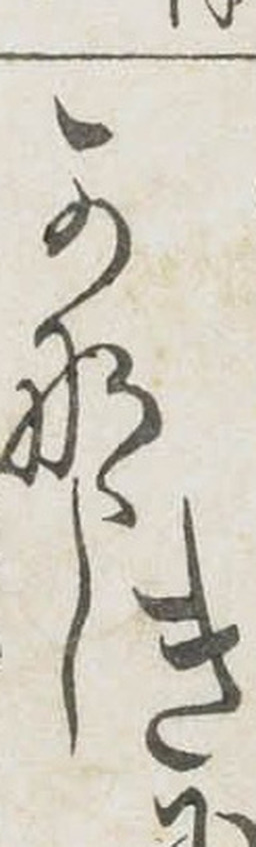かなし
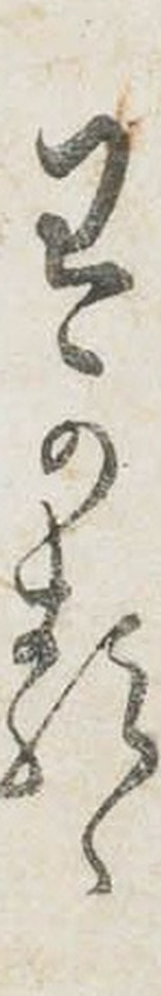わかるゝ
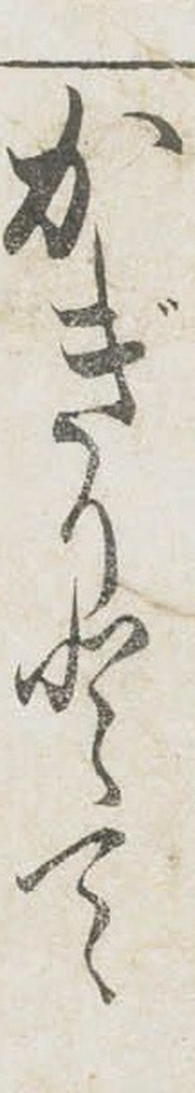かぎりとて
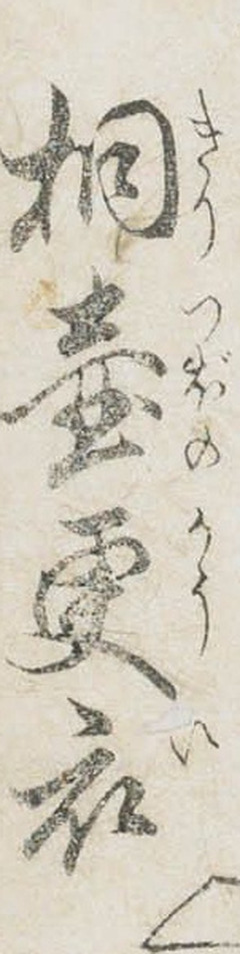桐壺更衣
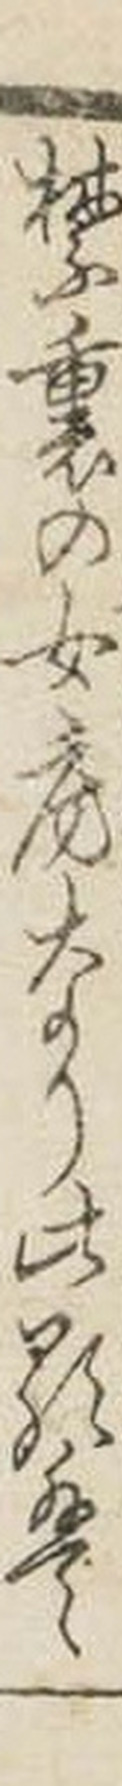禁裏の女房なり此歌は
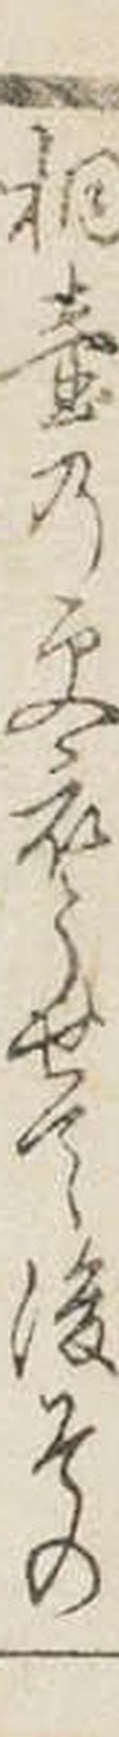桐壺の更衣うせて後その
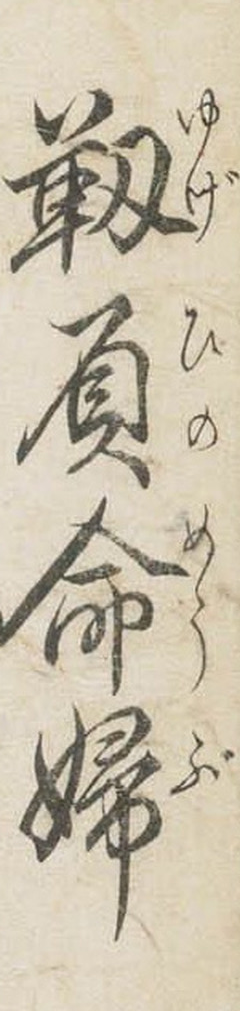靫負命婦
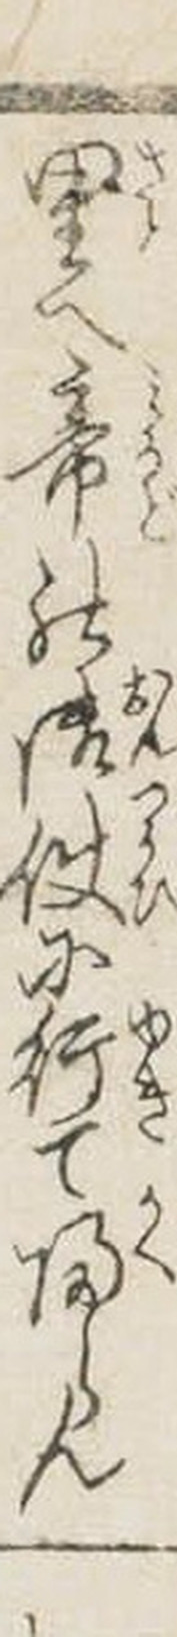里へ帝の御使に行て帰らん
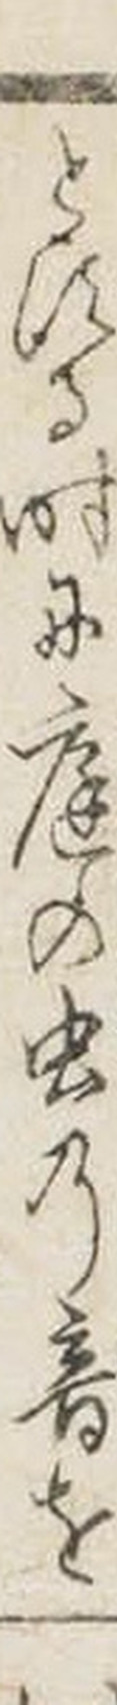とする時に庭の虫の音を
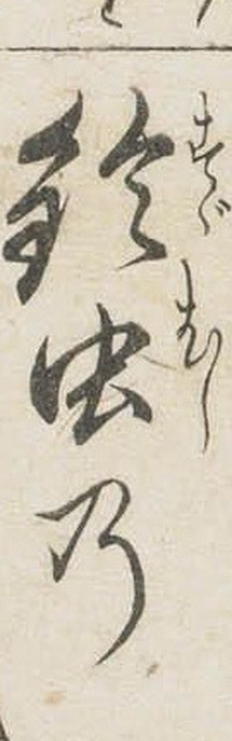鈴虫の
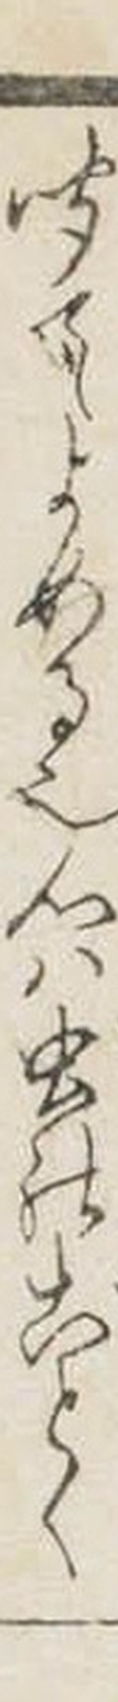聞てよめるな也心は虫のごとく
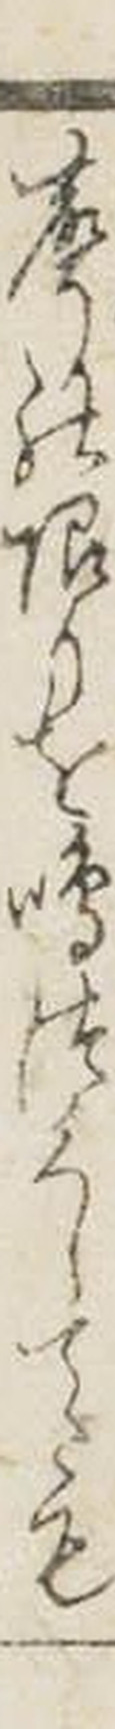声の限りを鳴つくしても
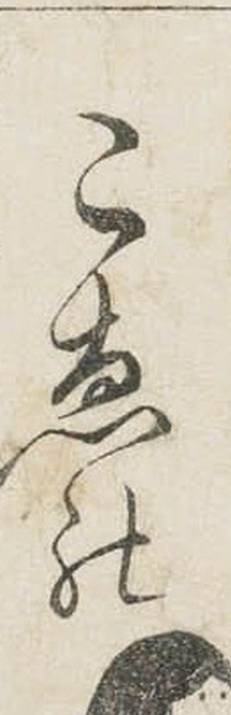こゑの
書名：源氏百人一首
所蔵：東京学芸大学教育コンテンツアーカイブ
